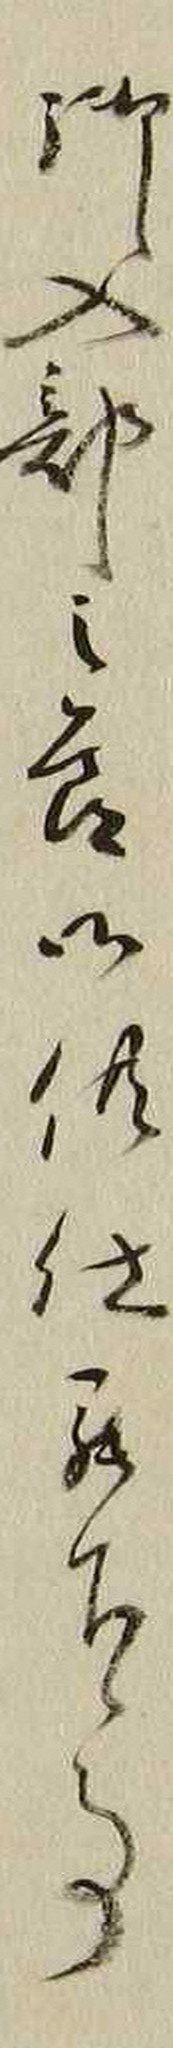御入部之節御供仕罷下候事
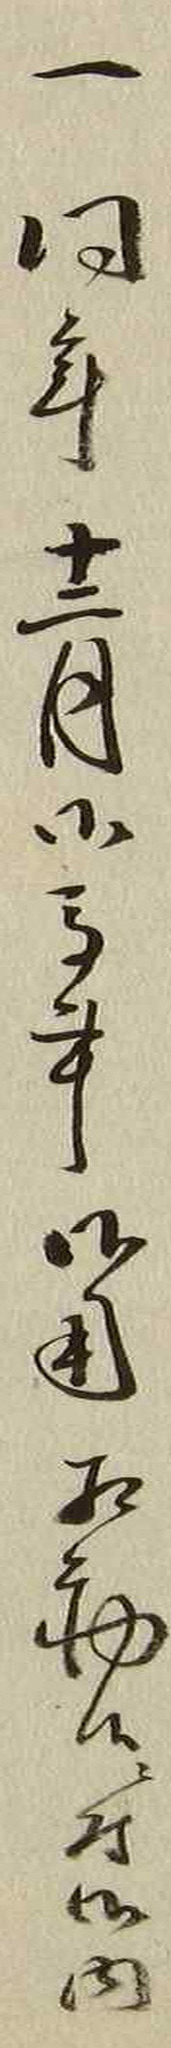一同年十二月御馬事御用相勤候ニ付御内
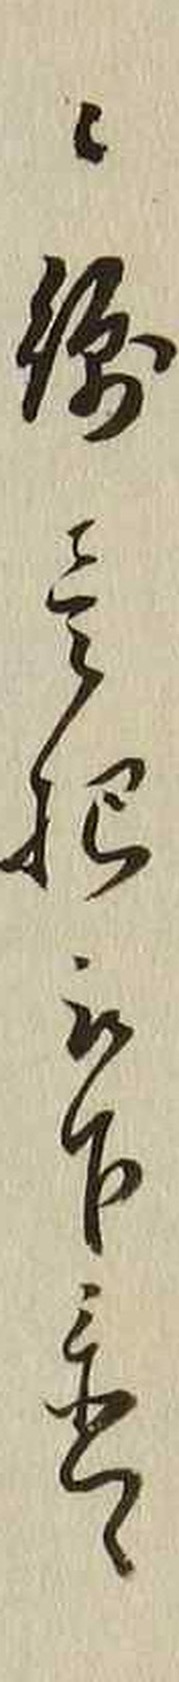々綿壱把被下置候
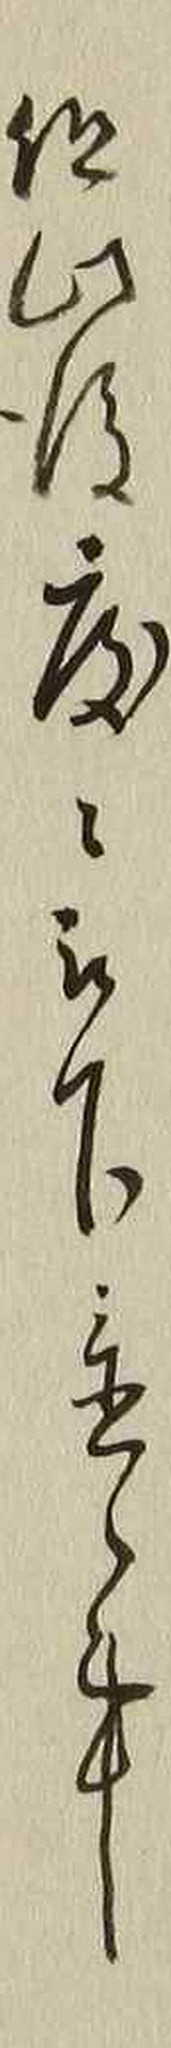仰此後度々被下置候事
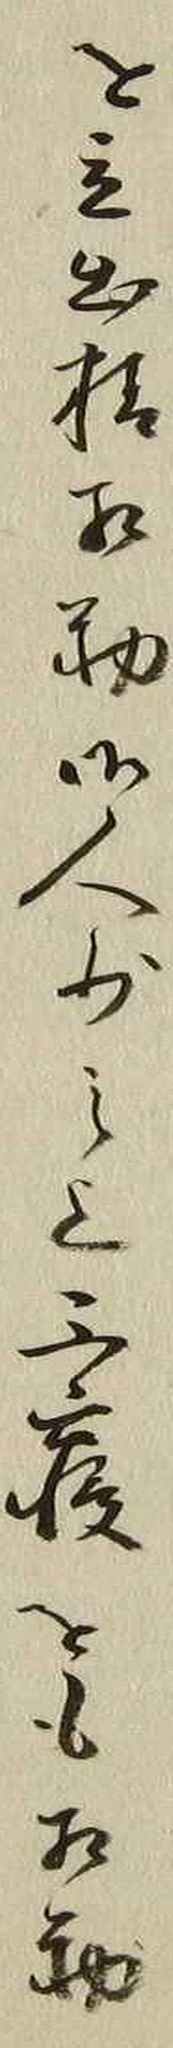を立出精相勤御人少之上不寝をも相勤
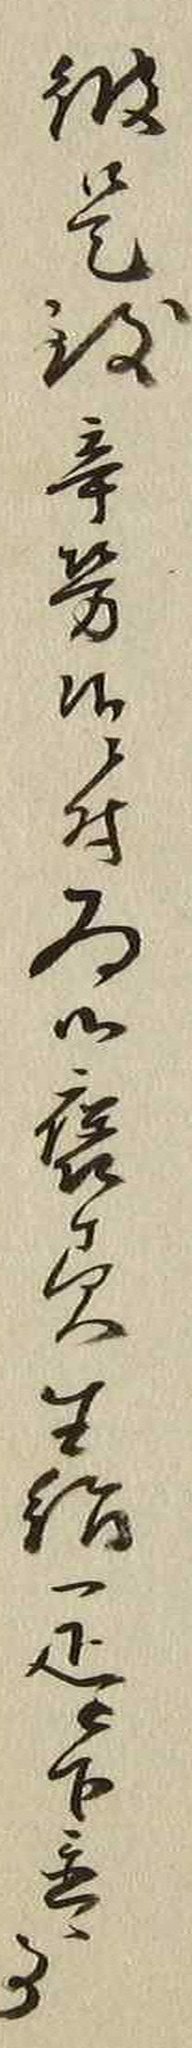彼是致辛労候ニ付為御褒美生絹一疋被下置候事
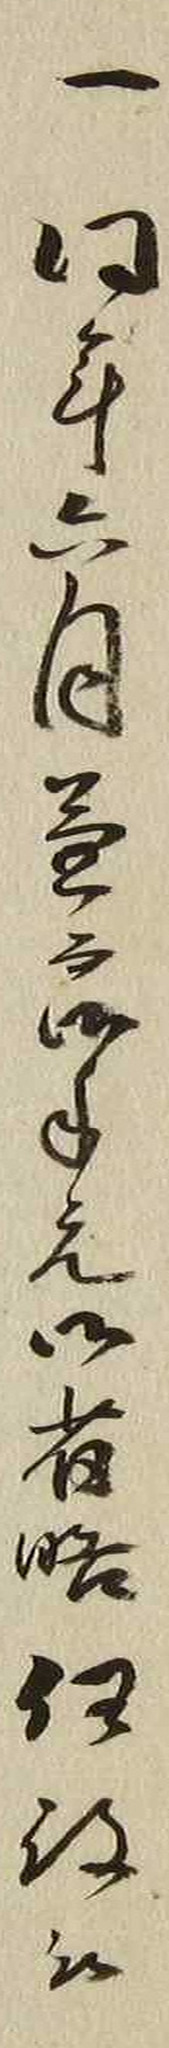一同年六月兼而御手元御省略任役被
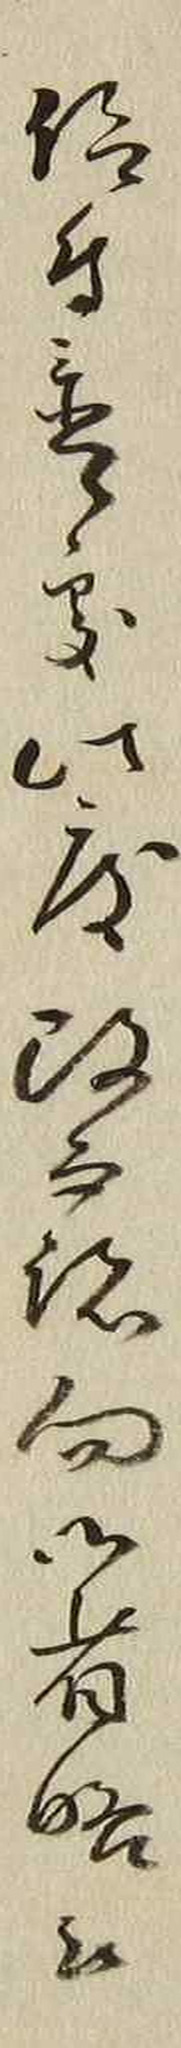仰付置候処此度改而諸向御省略被
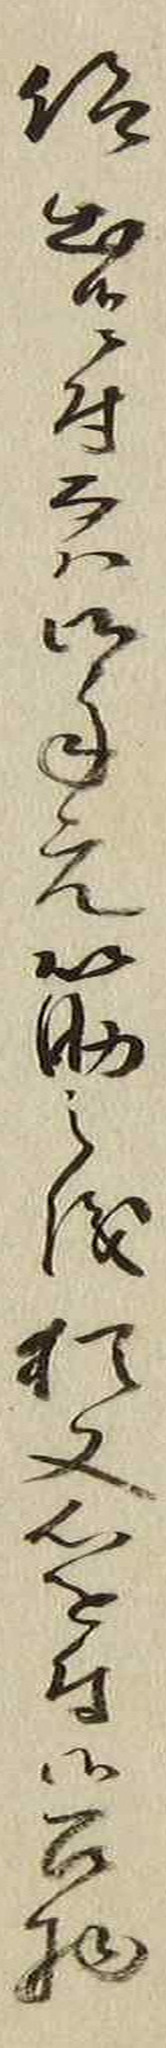仰出候ニ付而ハ御手元筋之儀猶又心を付御召物
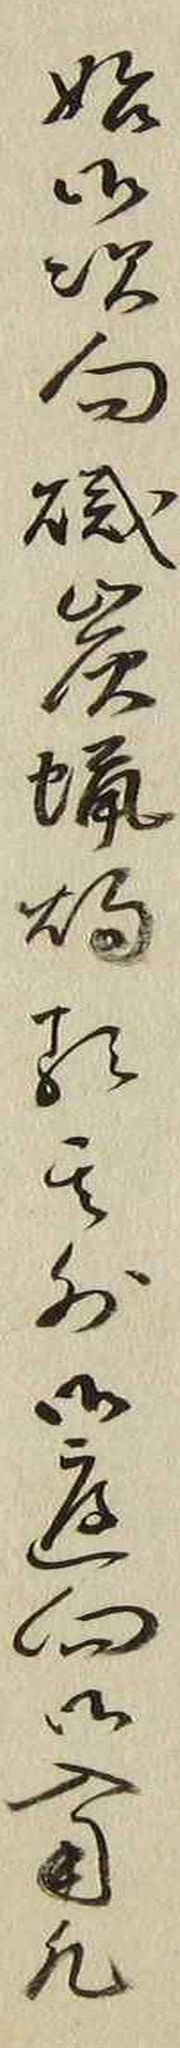始御次向熾炭蝋燭類其外御庭向御入用凡
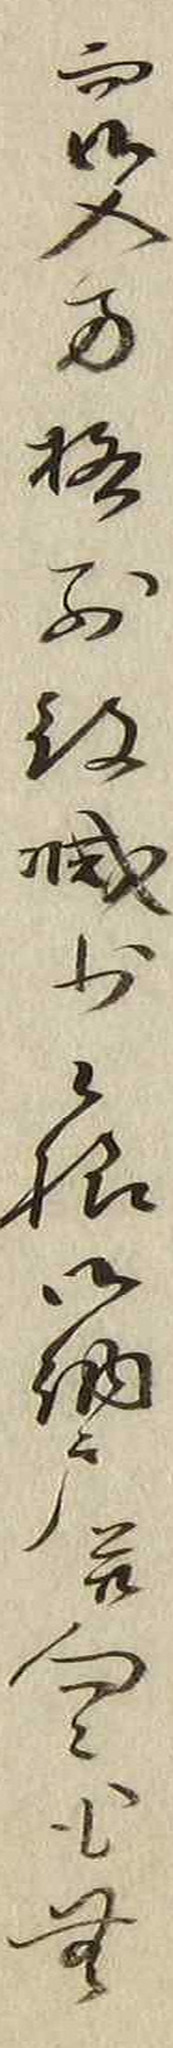而御入方格別致減少候様御納戸并向々へも無
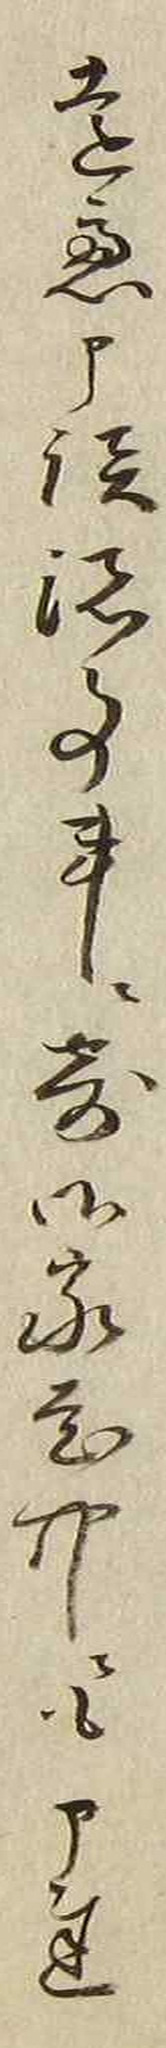遠慮申談諸事事ニ寄御家老中ニも申達
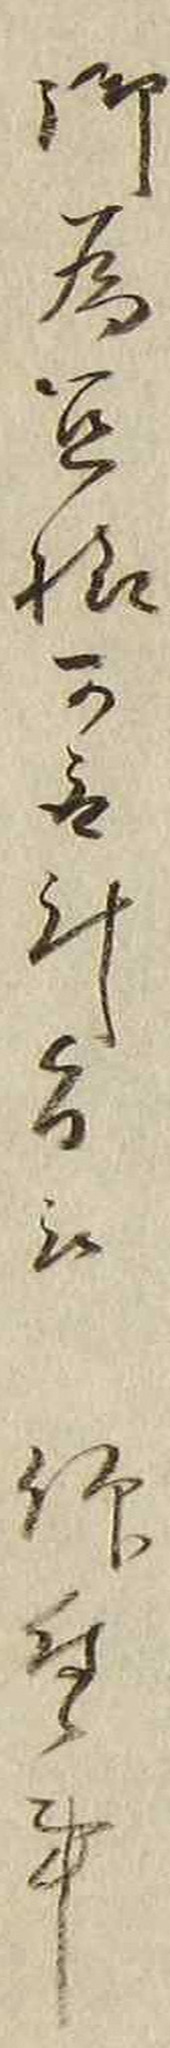御為宜様可取計分旨被仰付候事

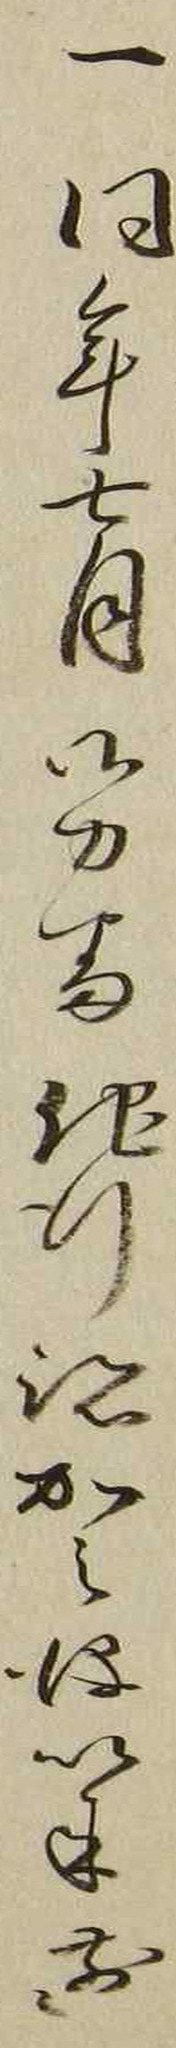一同年七月御刀番他行跡加之儀以来前々
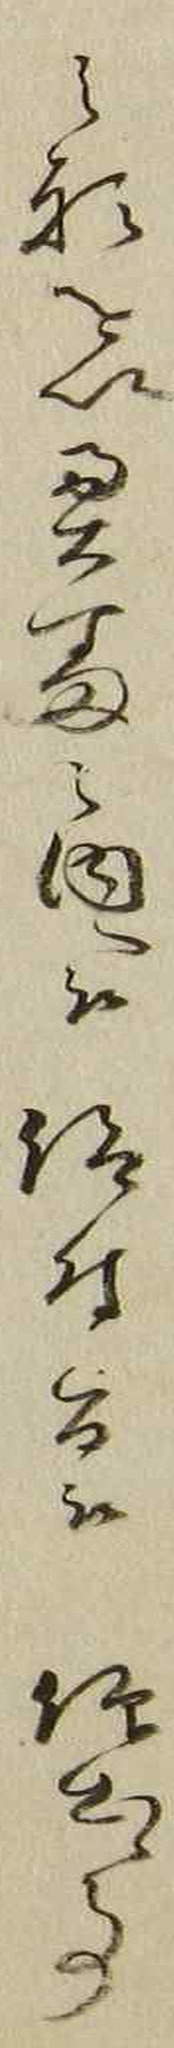之願を以奥番之内へ被仰付旨被仰出候事
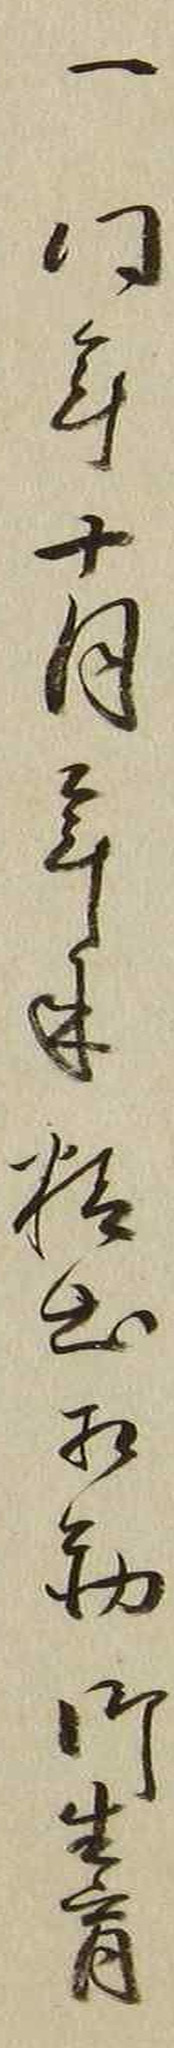一同年十月年来精出相勤御生育
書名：諸士系譜　巻之25　い之部25
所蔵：会津若松市立会津図書館
